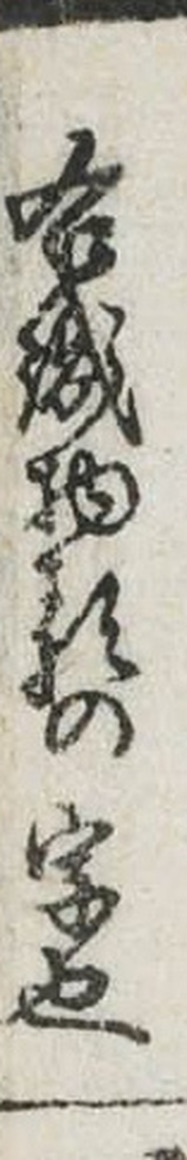右織物類の字也
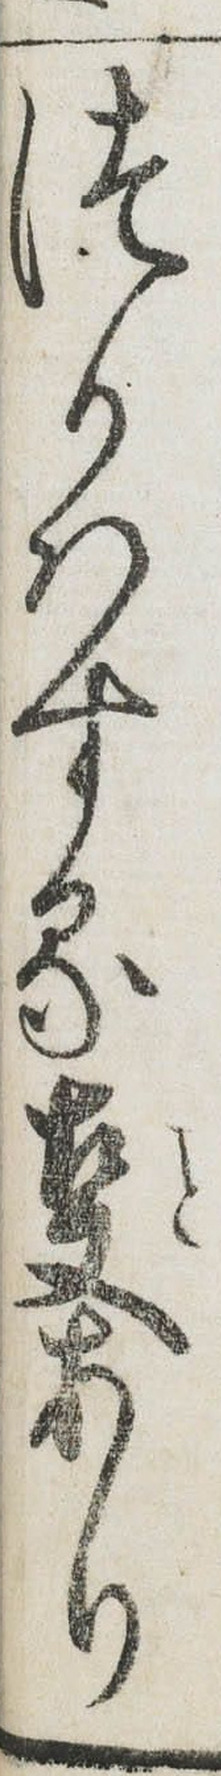つかはする事あり
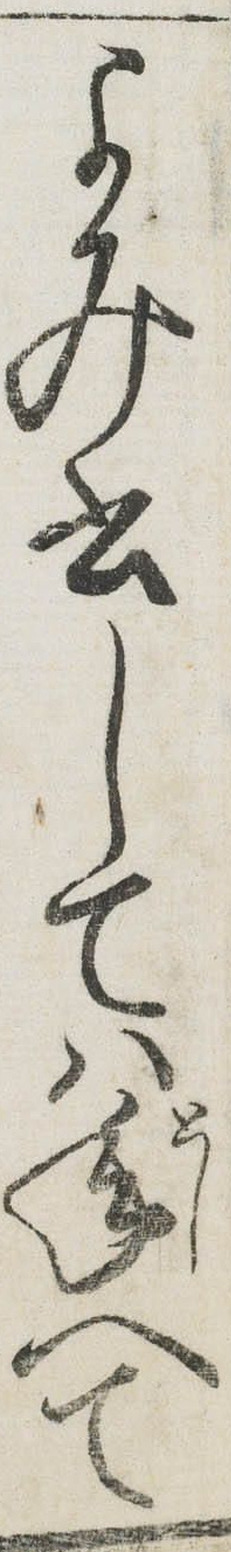よみ書しては年へて
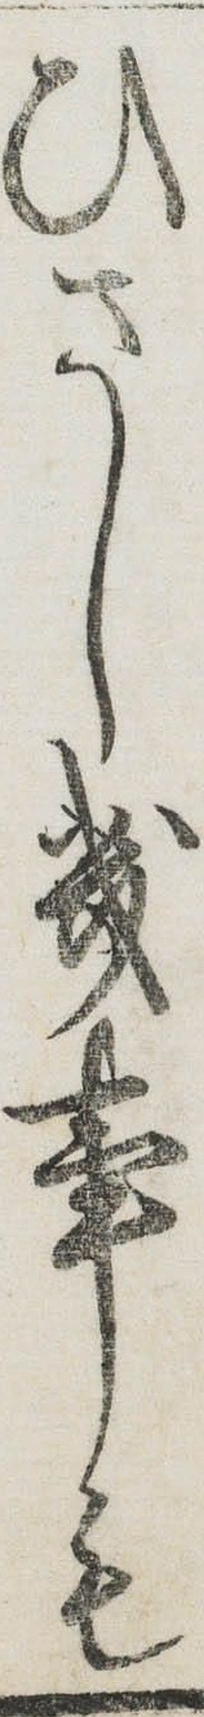ひさしき事も
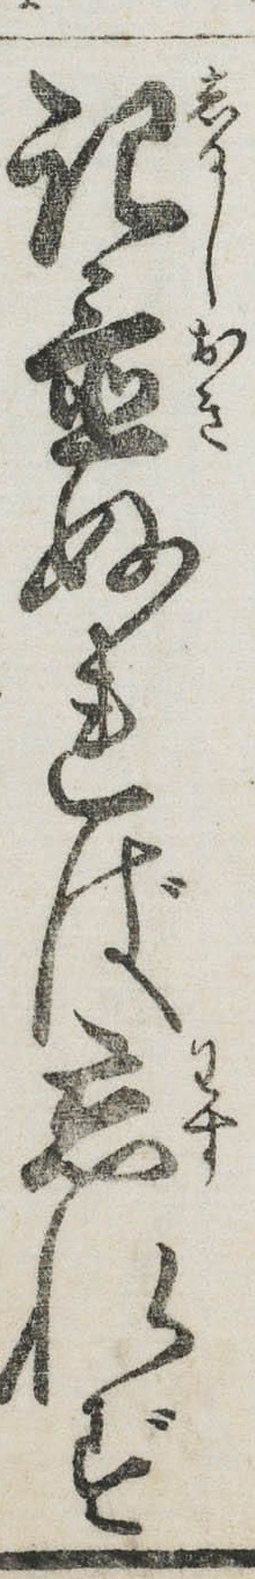記置ぬれば忘れず
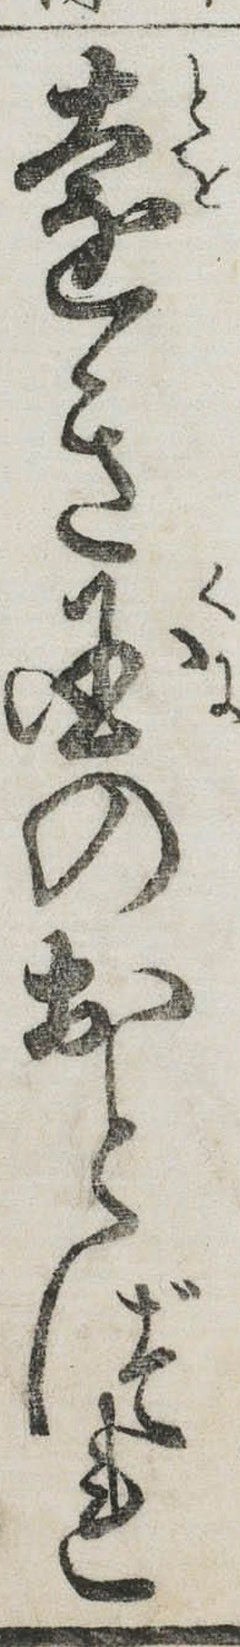遠き国のおとづれ
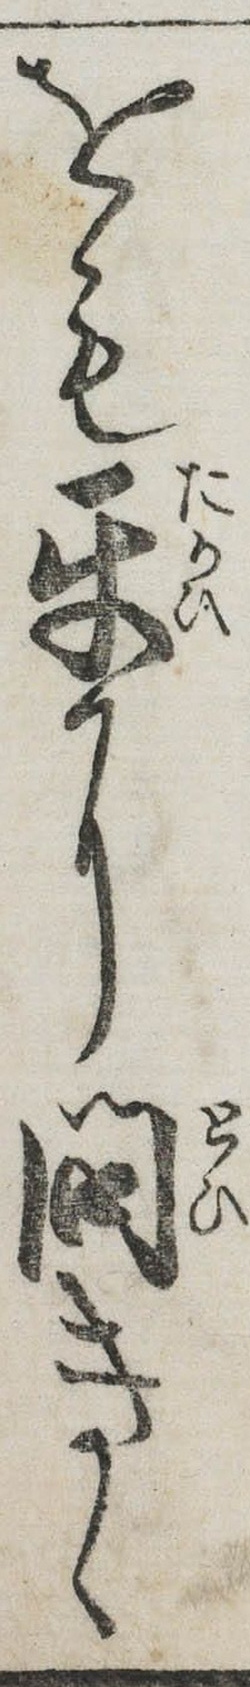をも互に問きゝ
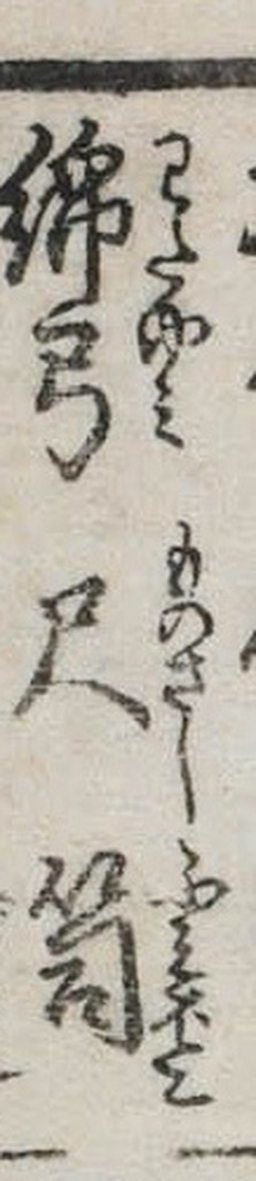綿弓尺笥
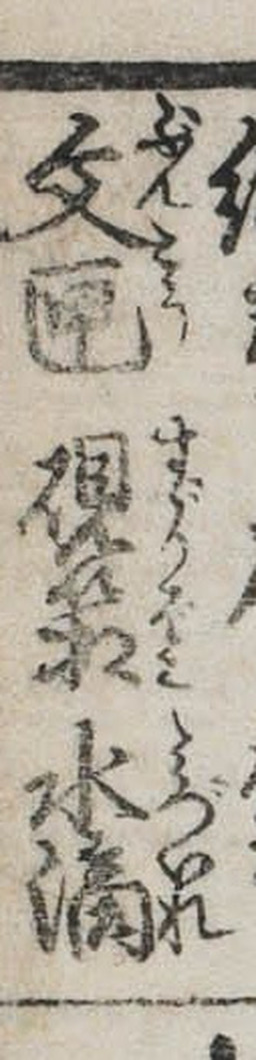文匣硯箱水滴
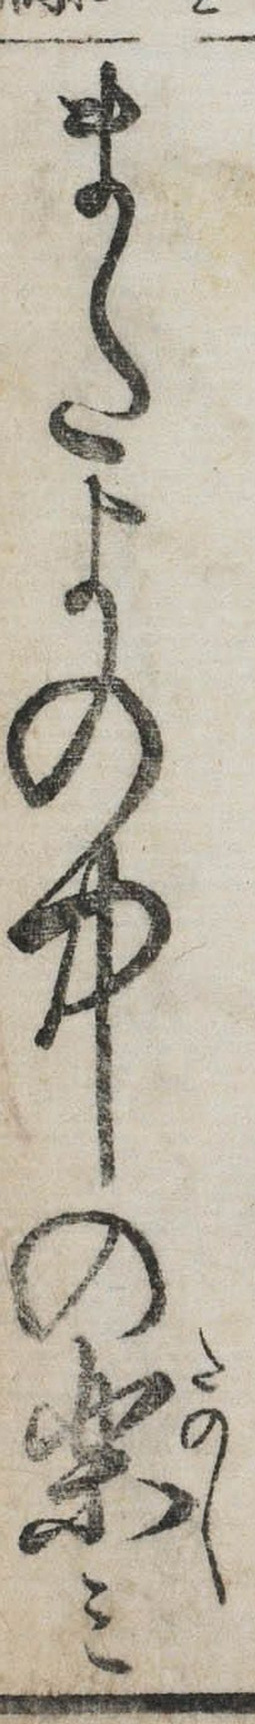またよの中の楽み

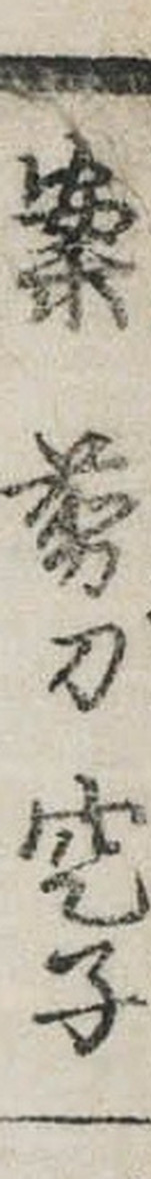案剪刀穵子
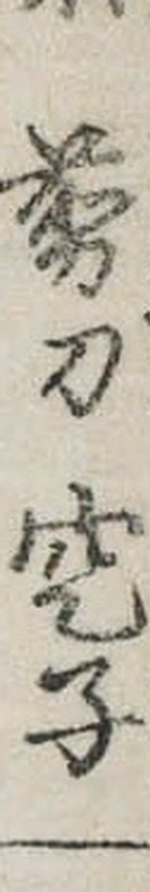案剪刀穵子
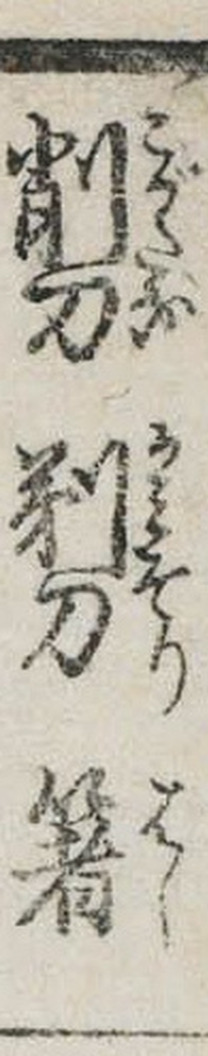削刀剃刀箸
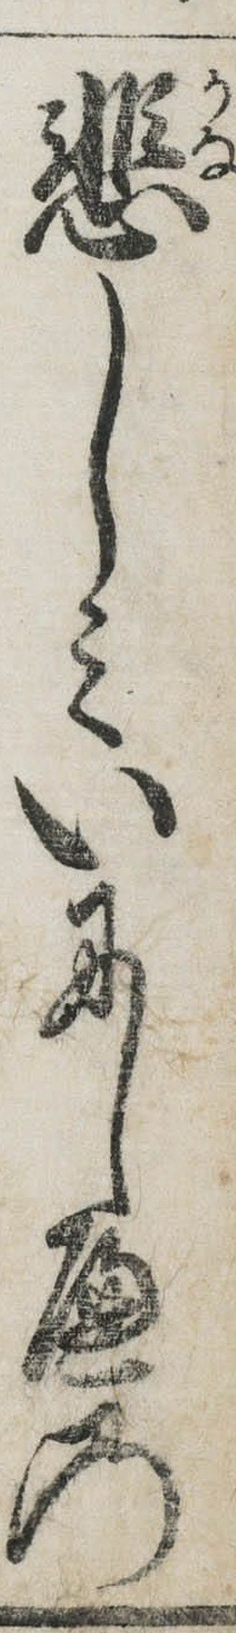悲しみいにしへの
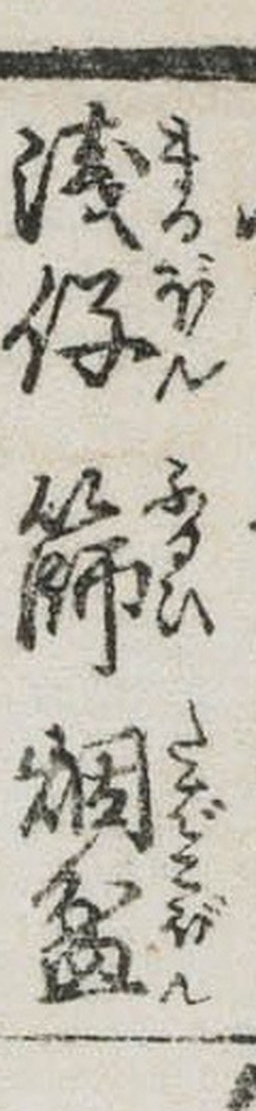浅仔篩烟盆
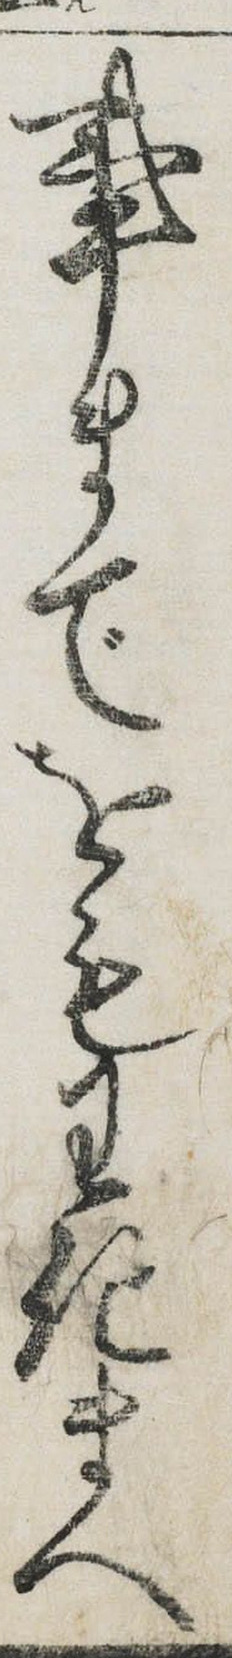事までをもわきまへ
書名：頭書萬用婦人手紙之文言
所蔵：東京学芸大学教育コンテンツアーカイブ
